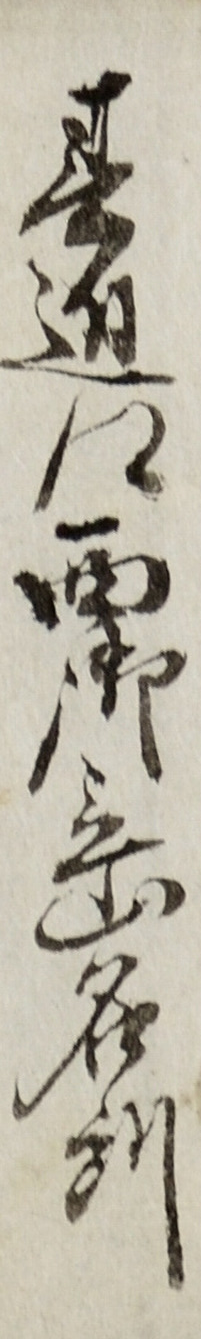春近郷西御立山名所
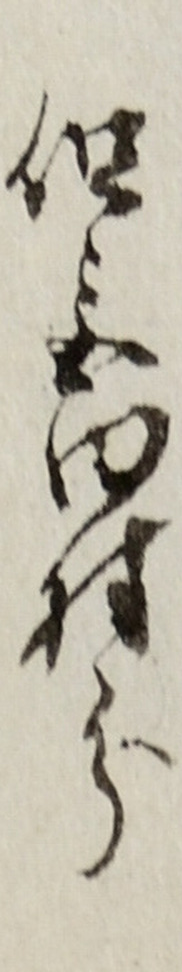但宮田村分
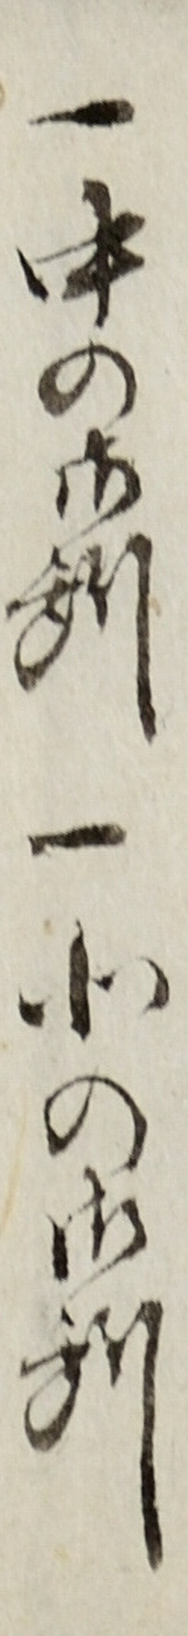一中の御所一北の御所
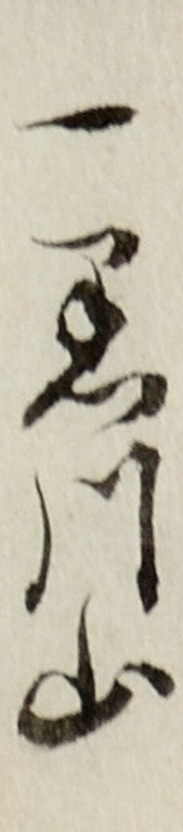一黒川山
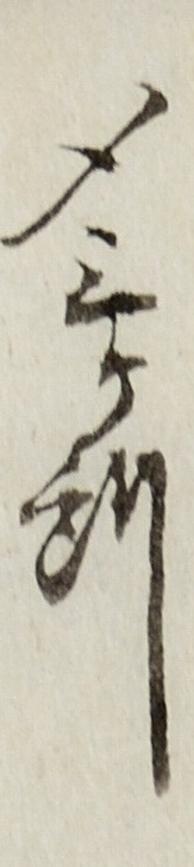〆三ケ所
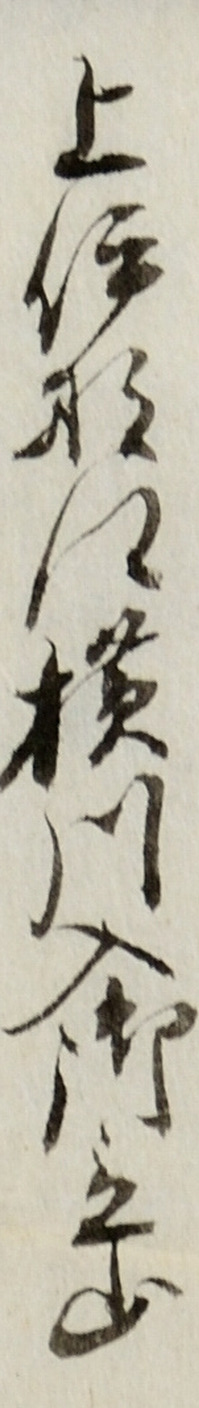上伊那郷横川入御立山
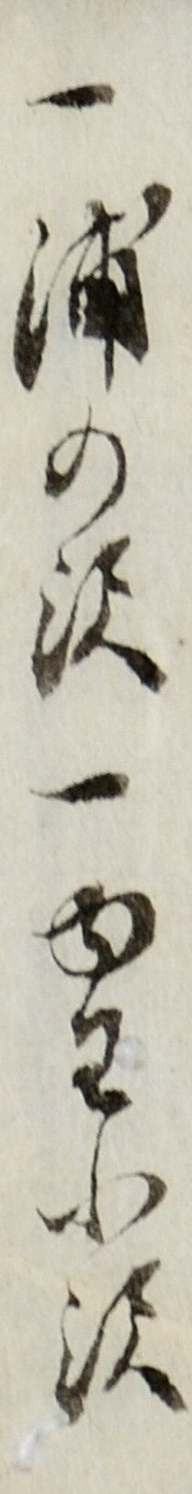一浦の沢一ゆわ小沢
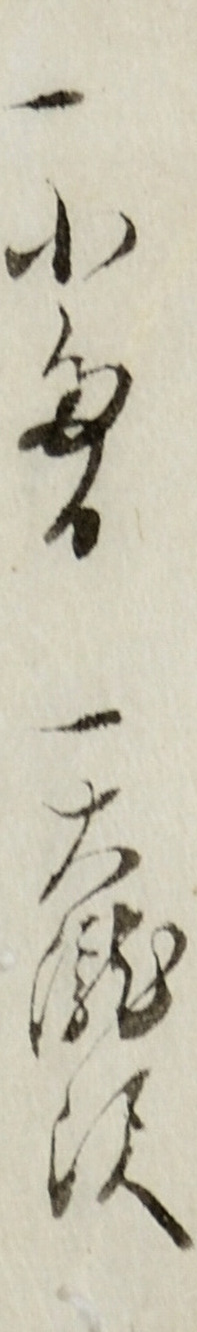一小たる一大瀧沢
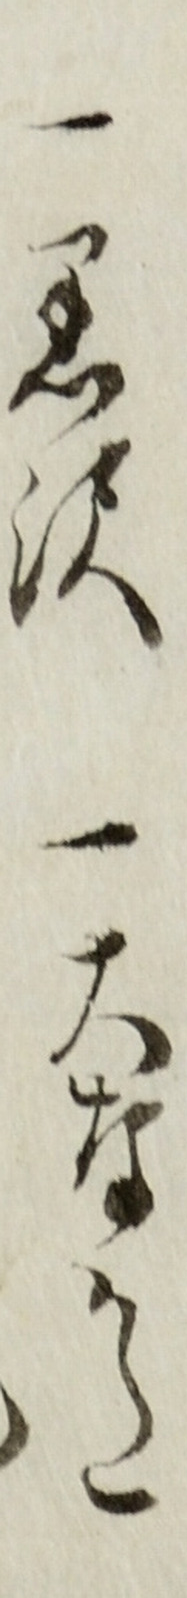一黒沢一大なかた
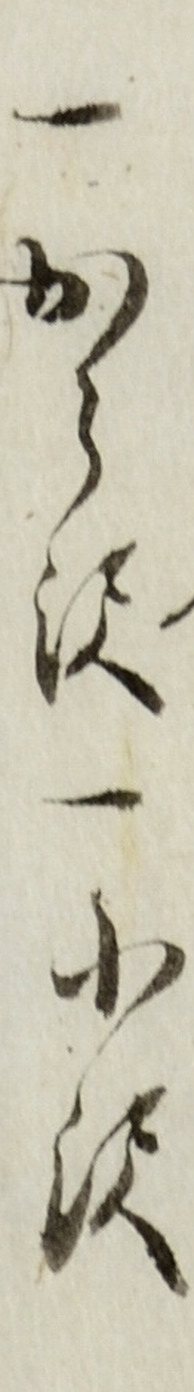一から沢一小沢
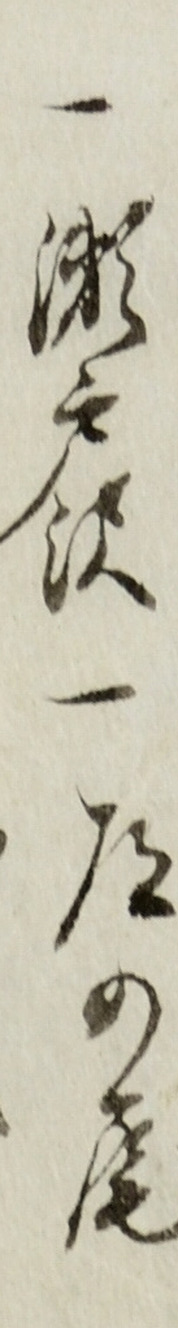一瀬戸沢一道の尾
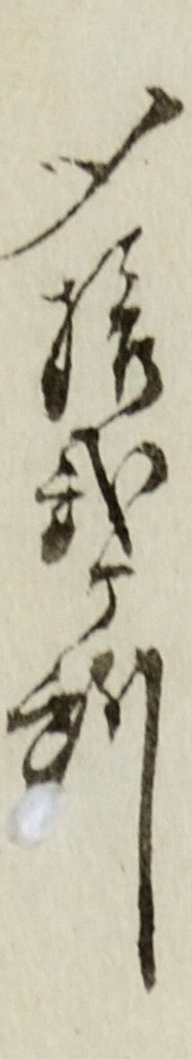〆拾弐ケ所
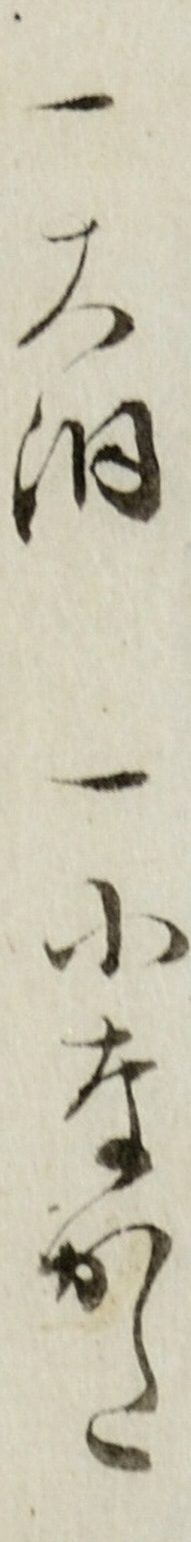一大洞一小なかた
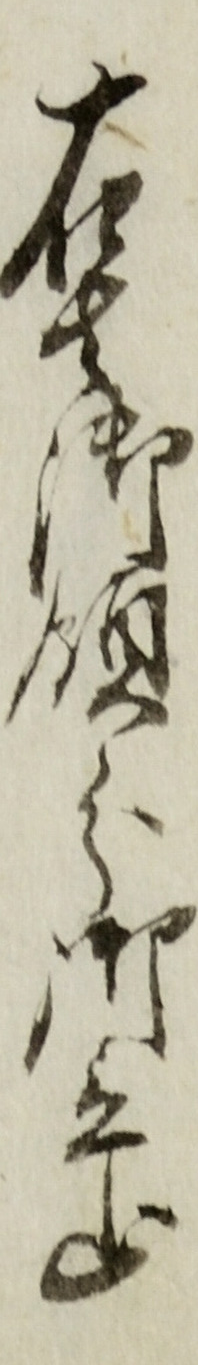右者御領分御立山
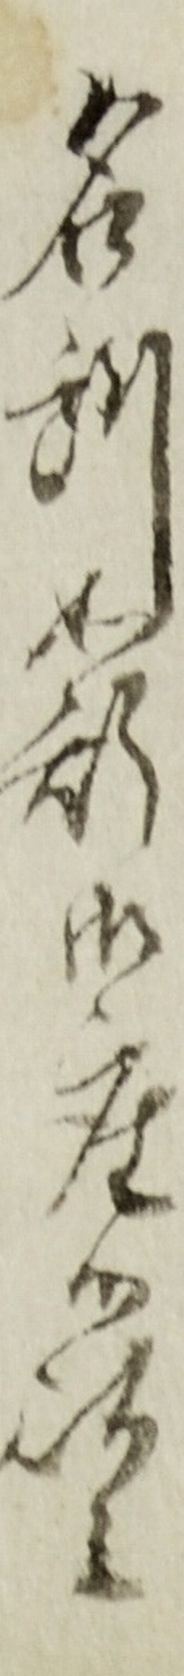名所如斯御座候以上
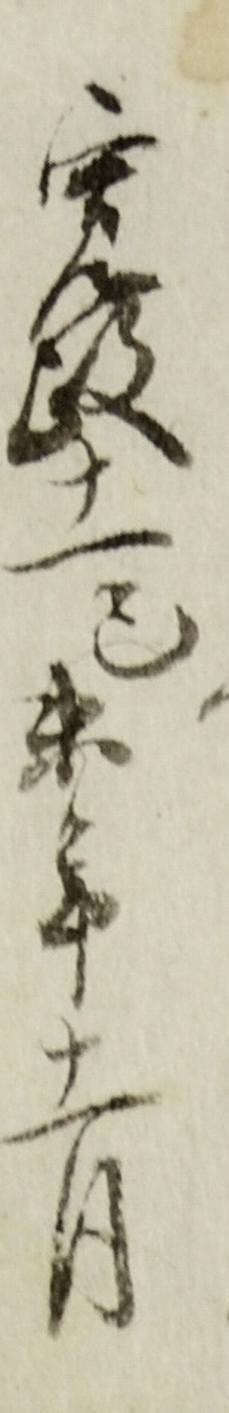寛政十一己未年十一月
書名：入野谷郷三峯川入御立山名所
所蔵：伊那市立高遠町図書館・合同会社AMANE
